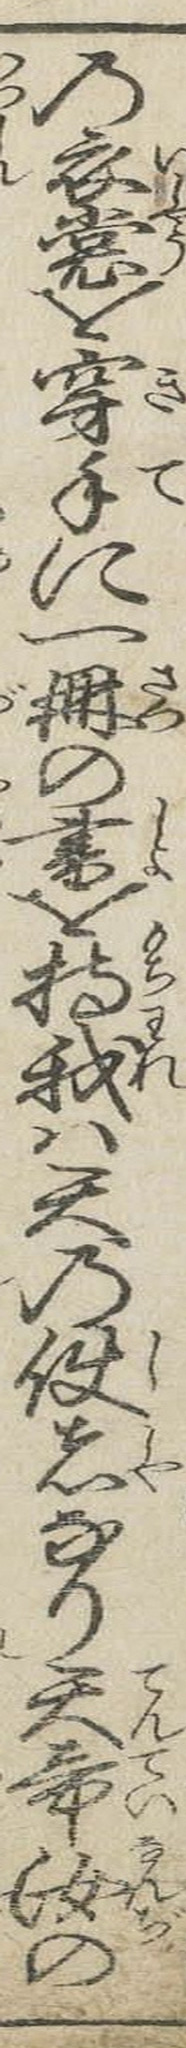の衣裳を穿手に一冊の書を持我は天の使者なり天帝汝の
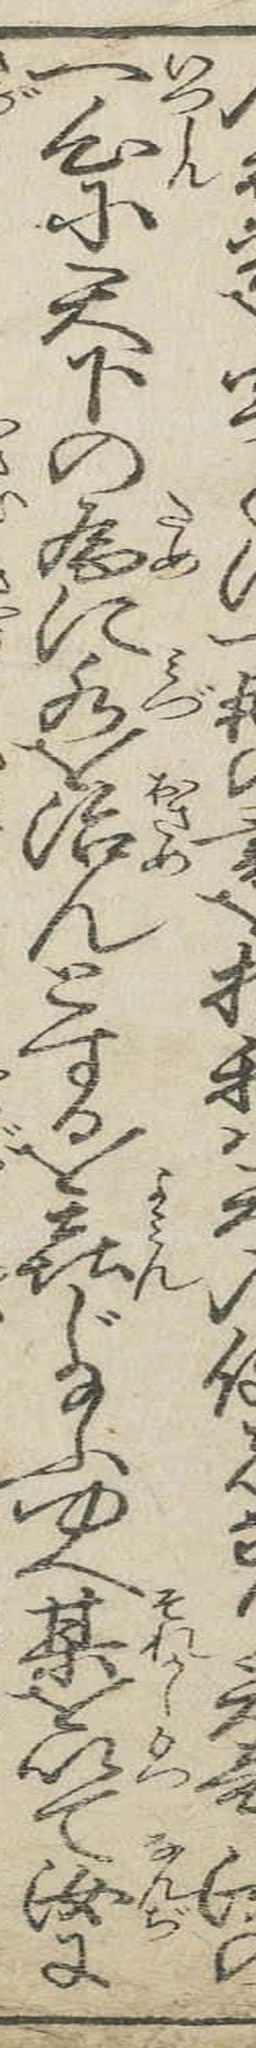一心に天下の為に水を治んとするを喜じ給ふゆへ某を以て汝に
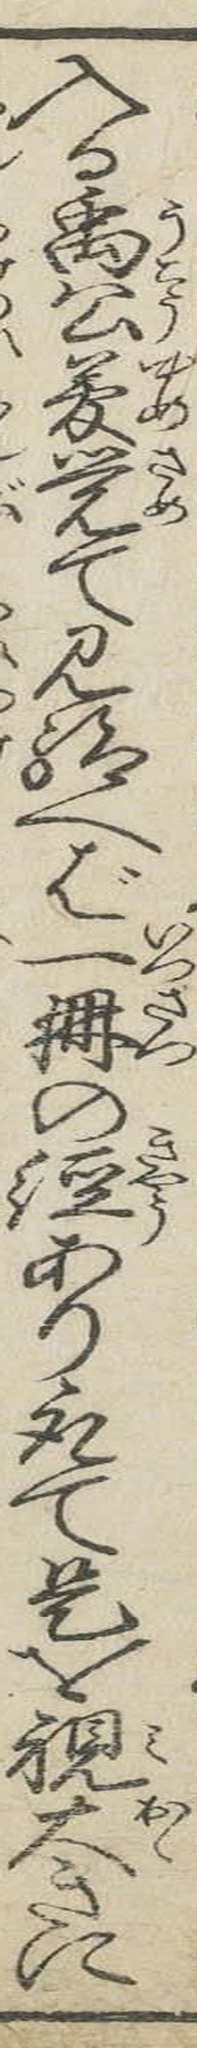入る禹公夢覚て見給へば一冊の経あり取て是を視大きに
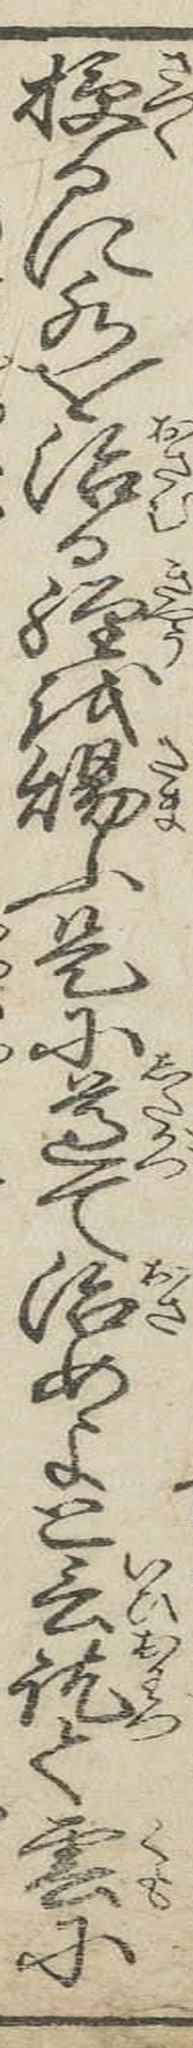授るに水を治る経を賜ふ是に遵て治めよと言訖て雲に
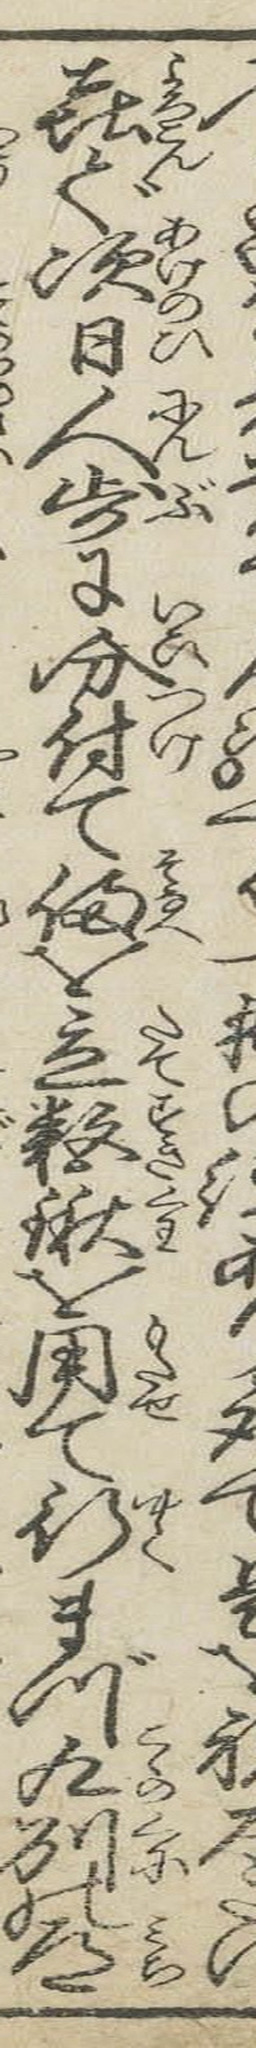喜で次日人歩に分付て備を立耟鍬を用て行まづ九州の道
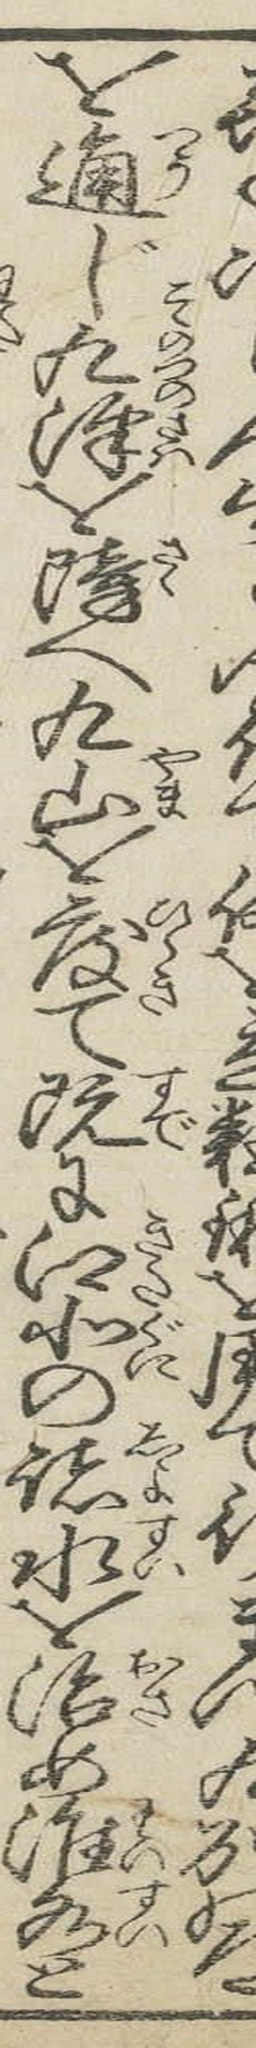を通じ九沢を障へ九山を度て既に江北の諸水を治め淮水と
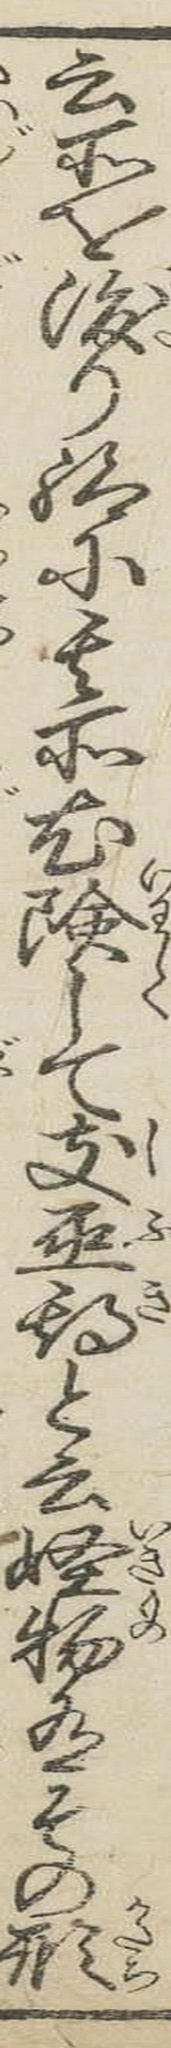云所を渡り給に其所尤険して支巫期と云怪物有その形
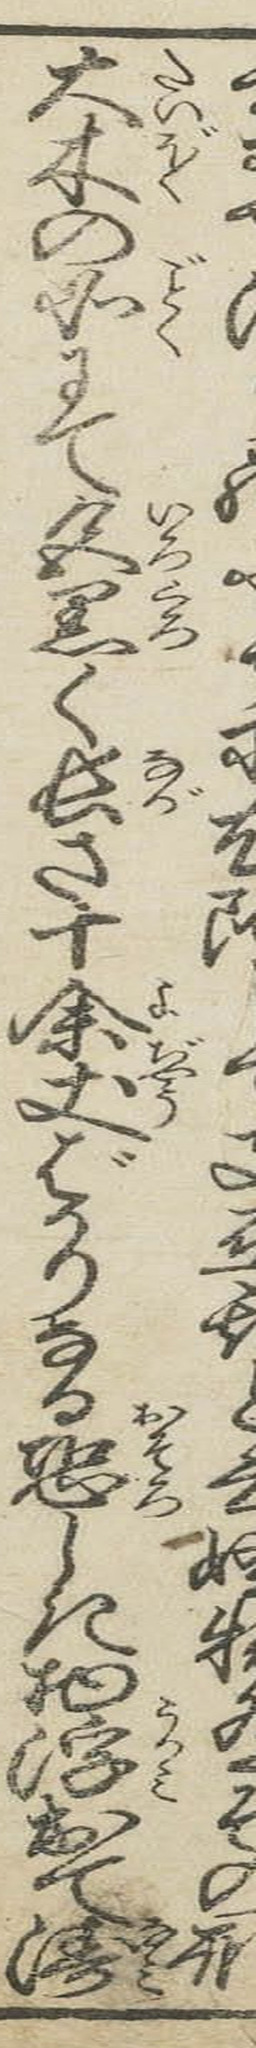大木の如にて色黒く長さ十余丈ばかりなる恐しき物浮出て涛
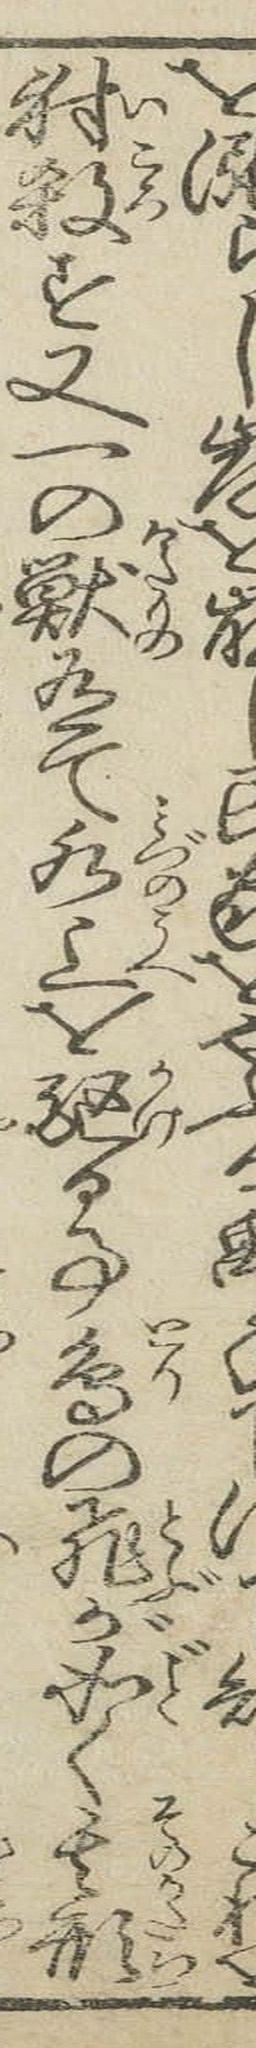射殺す又一の獣有て水上を駆る事鳥の飛が如く其形
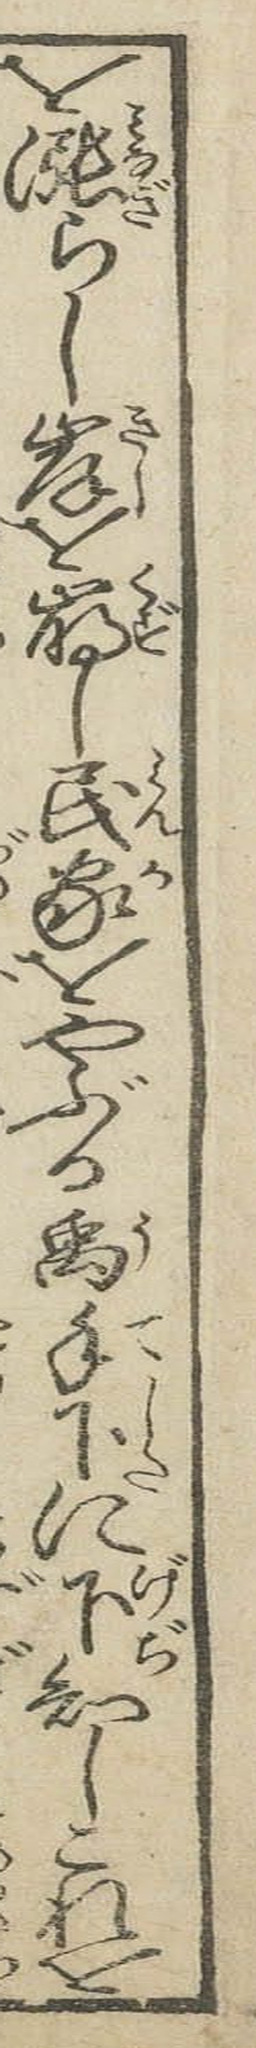を漲らし岸を崩し民家をやぶる禹手下に下知しこれを
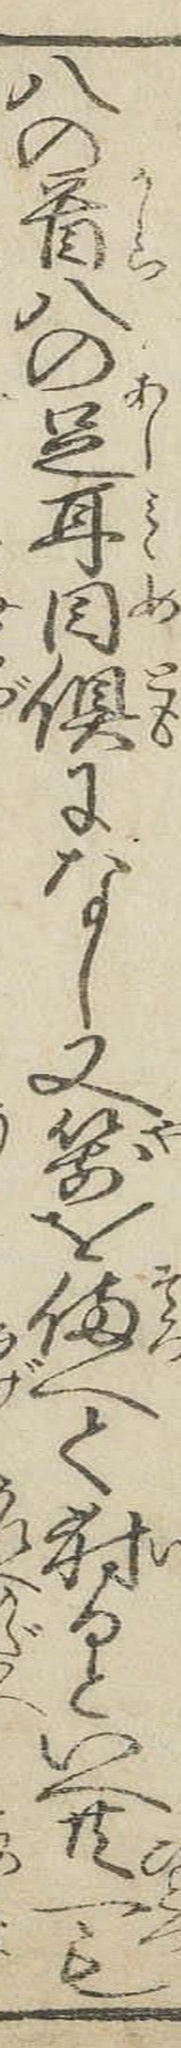八の首八の足耳目倶になし又箭を備へて射るといへ共一も
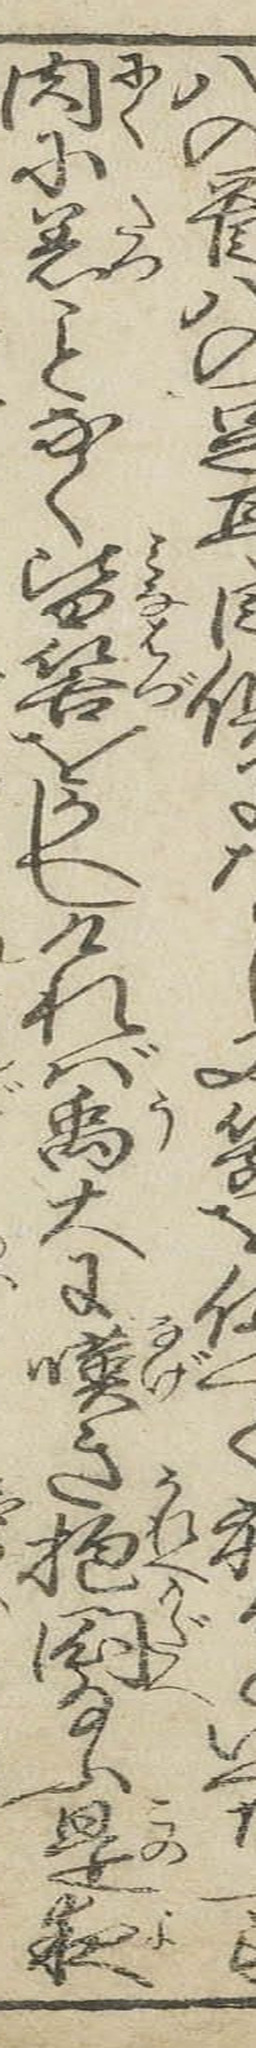肉に着ことなく皆筈をかへしければ禹大に嘆き抱悶給ふ是夜
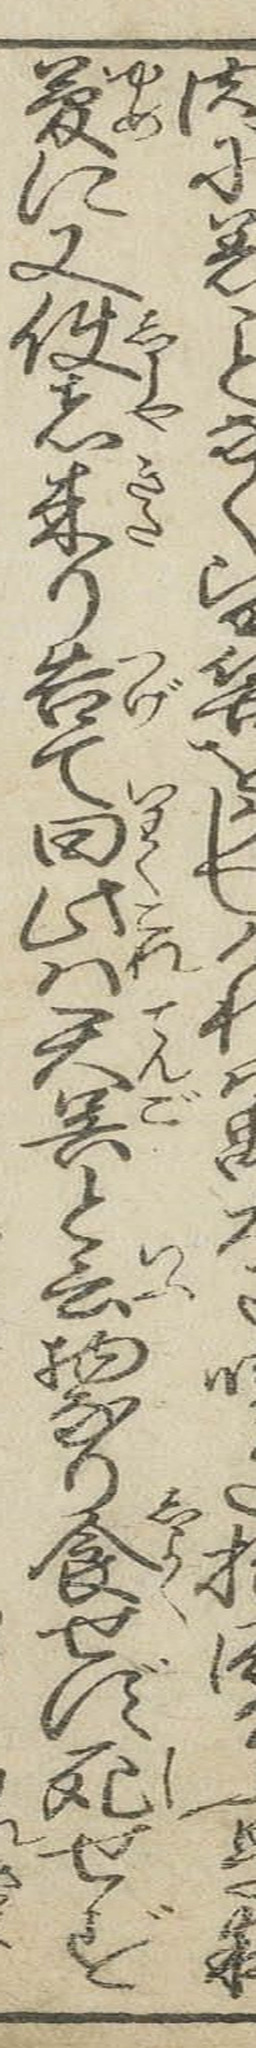夢に又使者来り告て曰此は天呉と云物なり食せず死せず
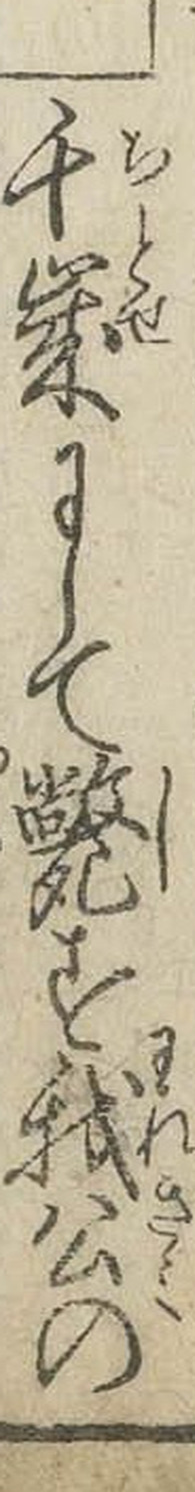千歳にして斃す我公の
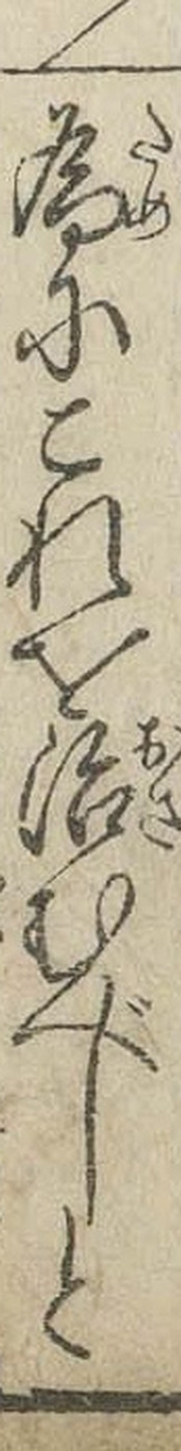為にこれを治むべしと
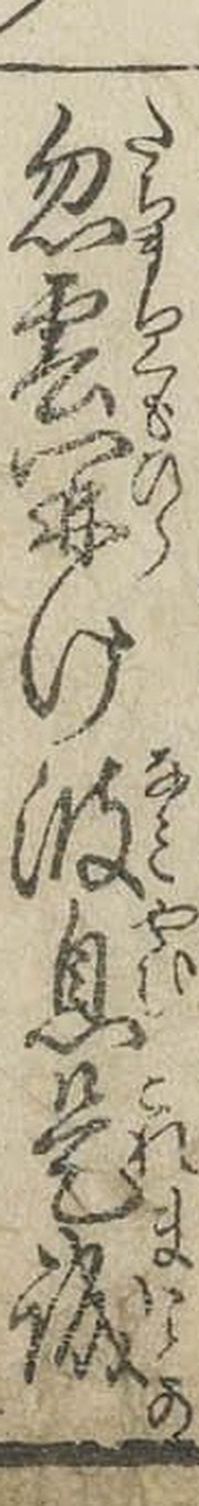忽雲開け波息是誠
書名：絵本写宝袋 9巻 4之巻
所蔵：東京学芸大学教育コンテンツアーカイブ
